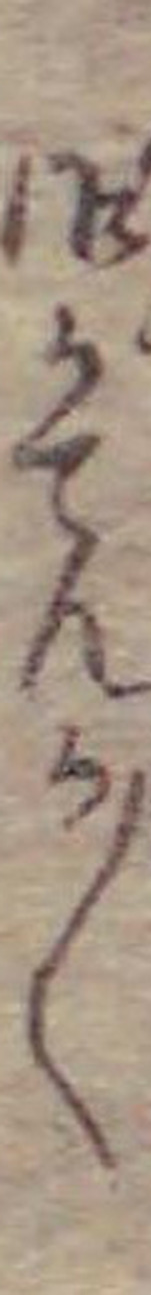御かてんか〳〵

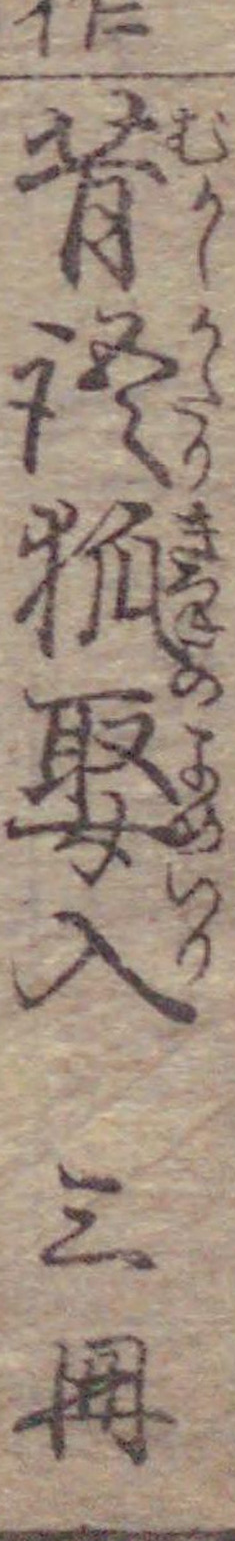昔語狐娶入三冊
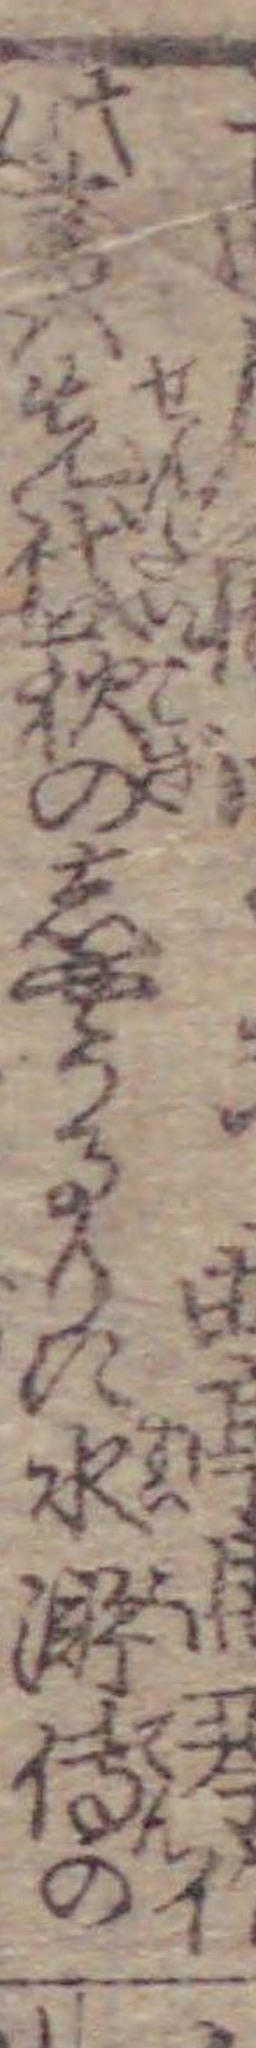此書は先代萩のしやうるりに水滸伝の
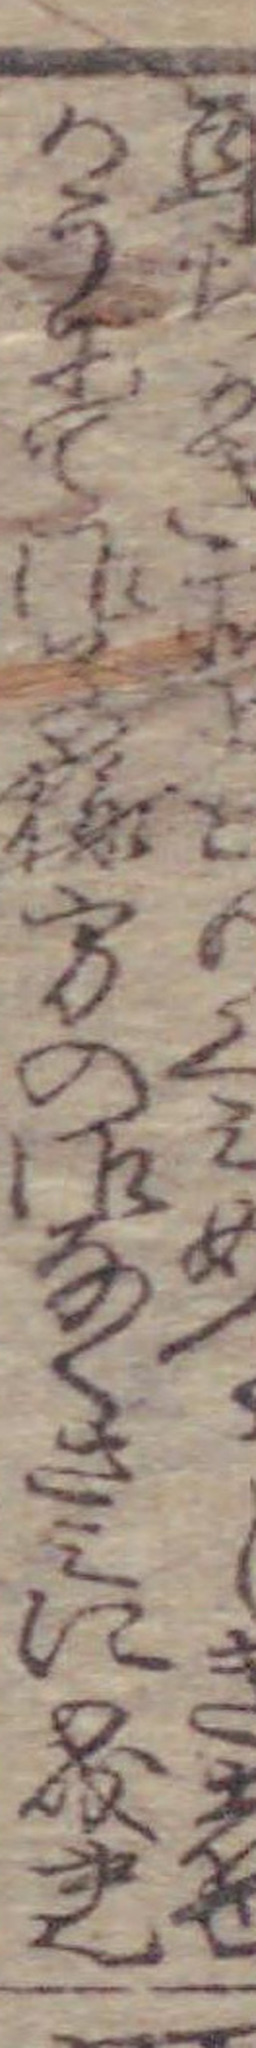かうにて御子様方の御なくさみに可成書也
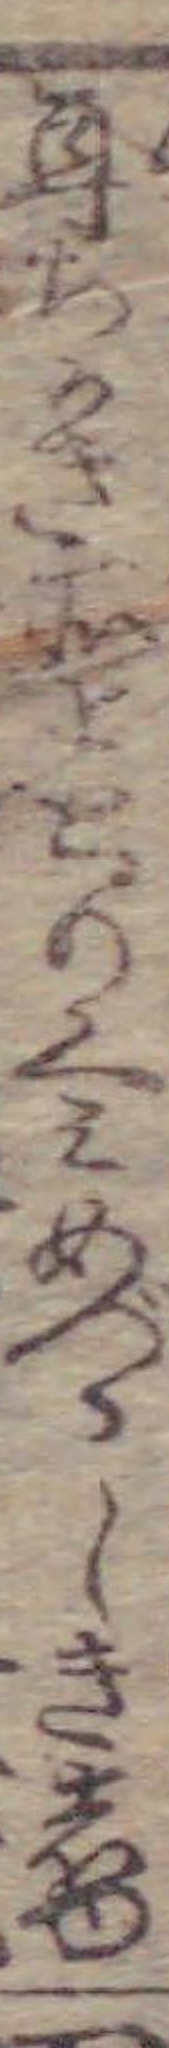耳ちかき所をとりかへみめづらしきしゆ
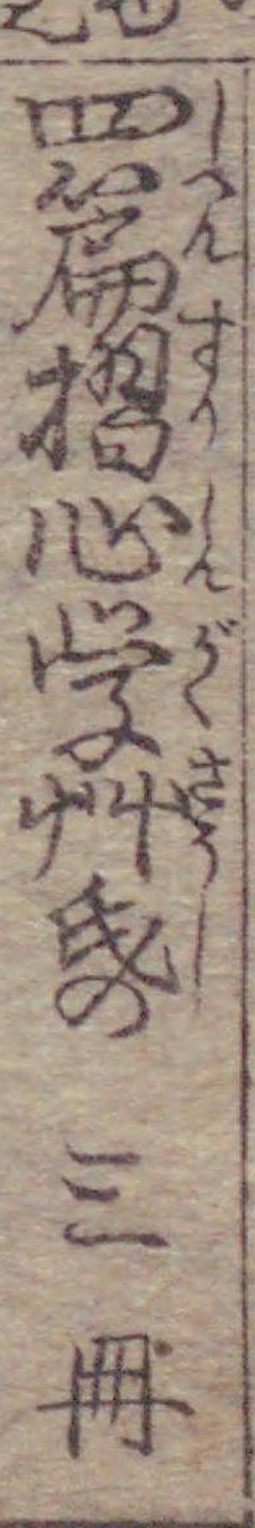四篇摺心学草紙三冊
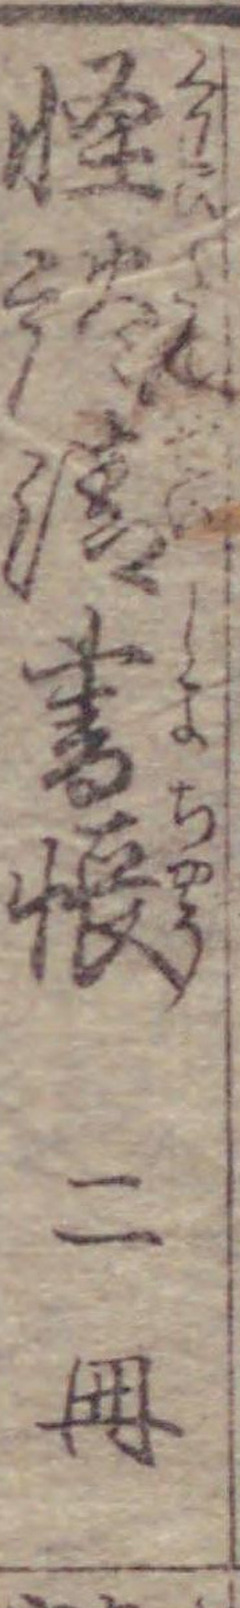怪談清書帳二冊
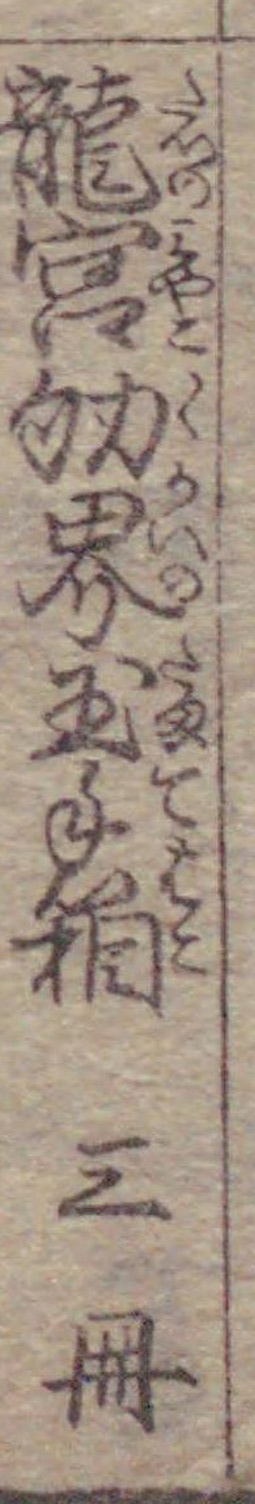龍宮劬界玉手箱三冊
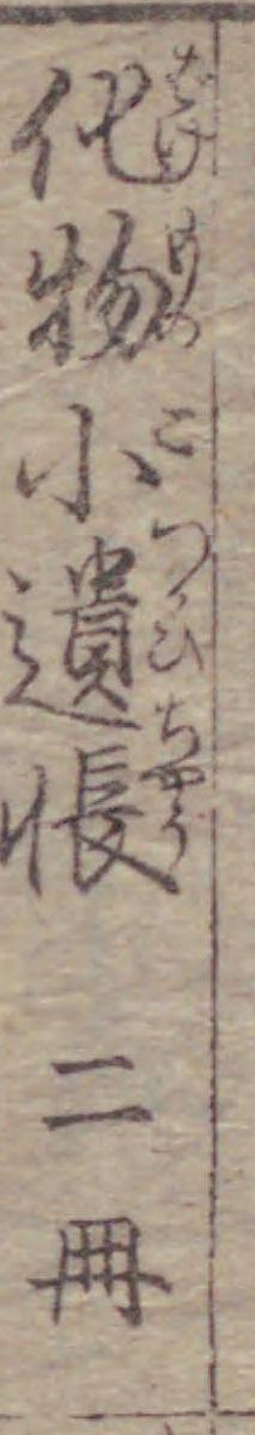化物小遣帳二冊
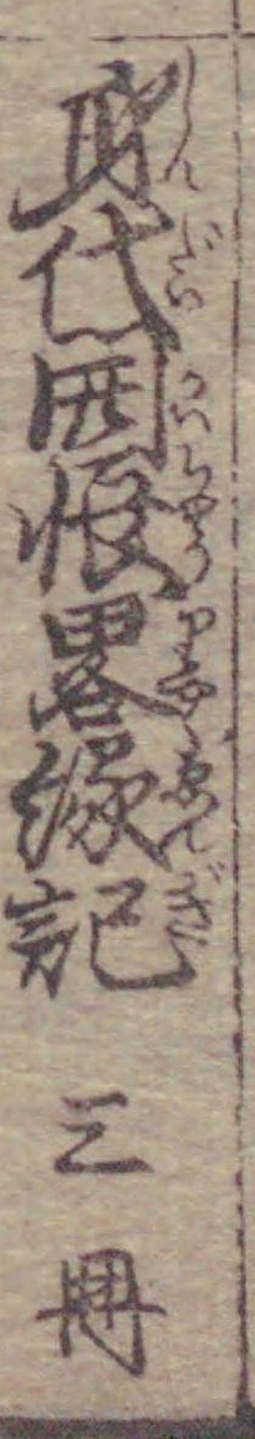身代開帳略縁記三冊
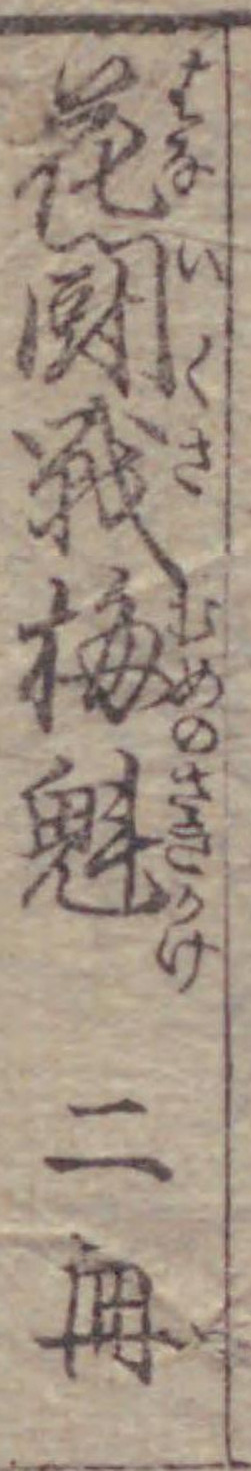花闘梅魁二冊
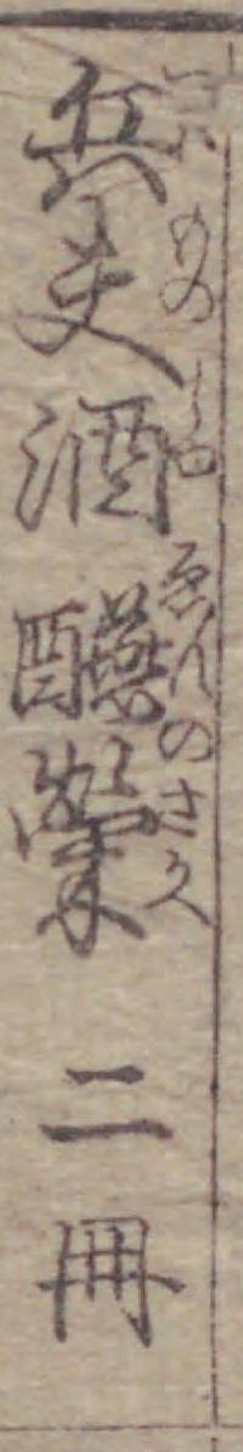兵夫酒醼栄二
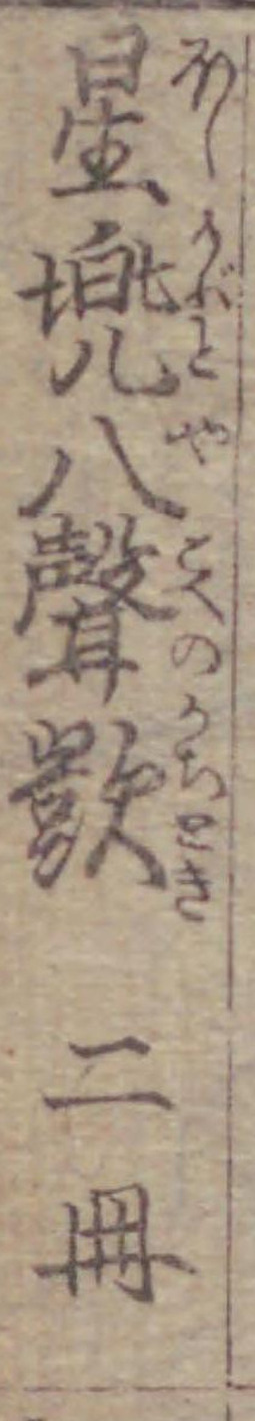星兜八声凱二冊
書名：万物小遣帳 : 2巻
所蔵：国立国会図書館 National Diet Library, JAPAN
